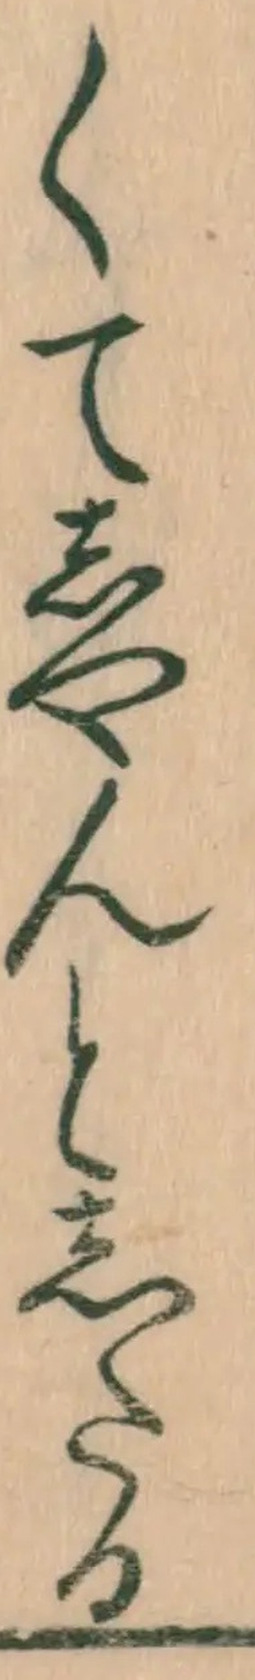くてしやんとしたる
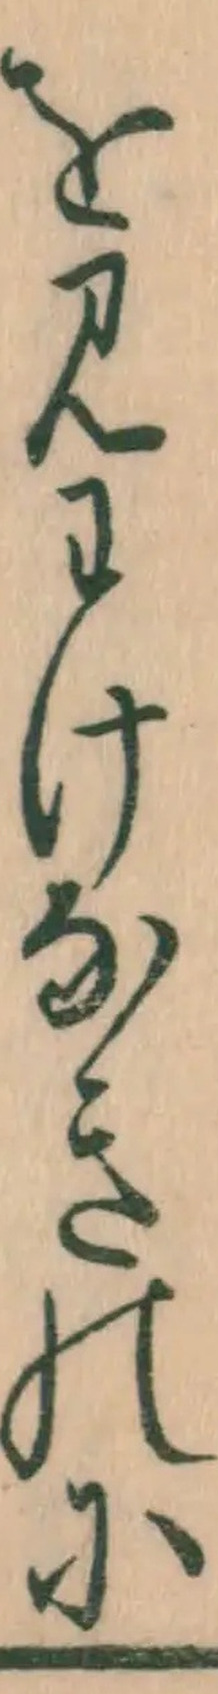を見わけなきのに
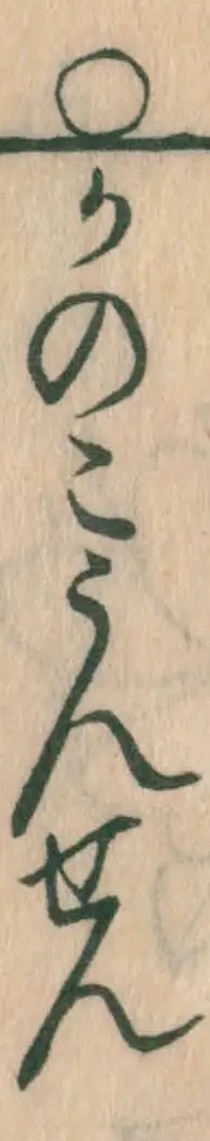○かのこうんせん
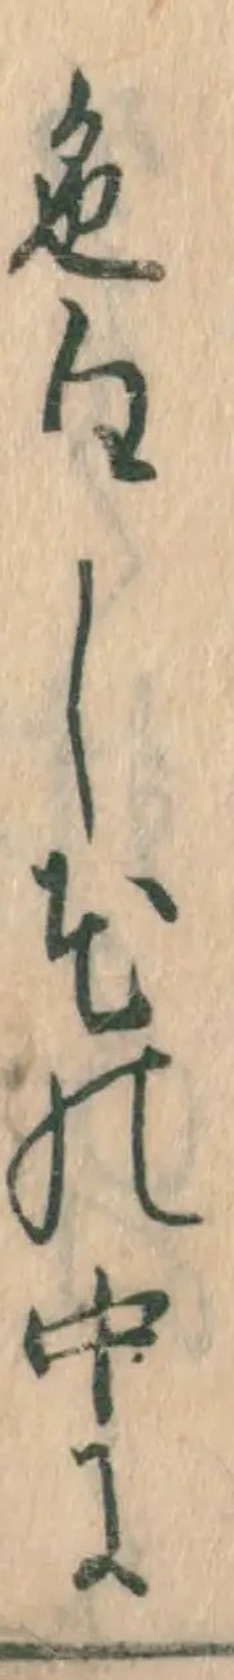色白し花の中に
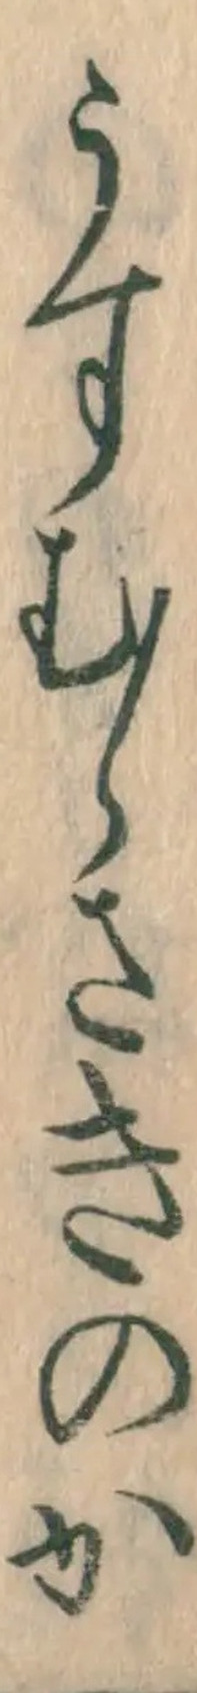うすむらさきのか

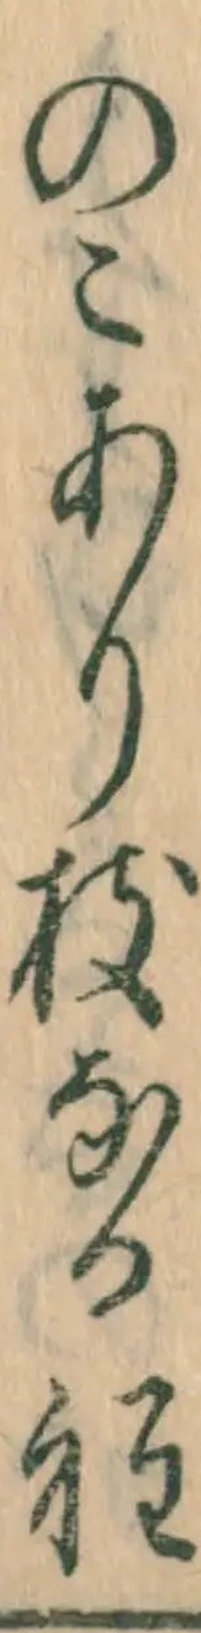のこあり枝なる程
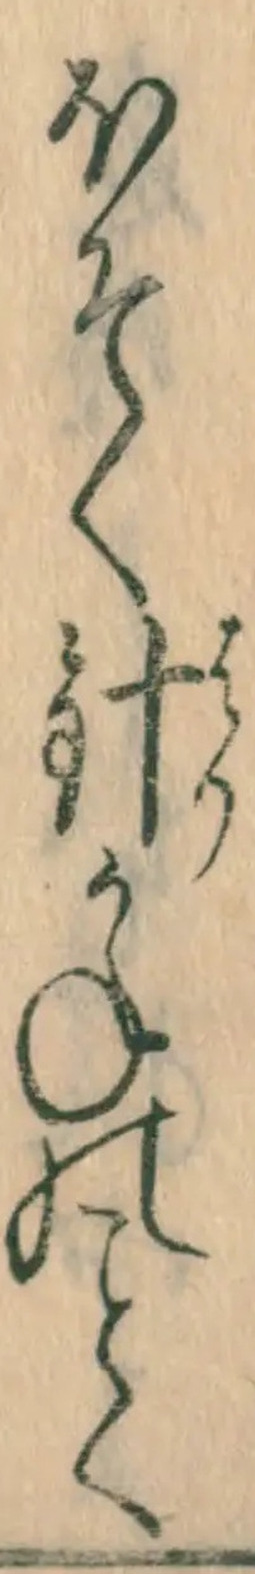ほそく針かねのことく
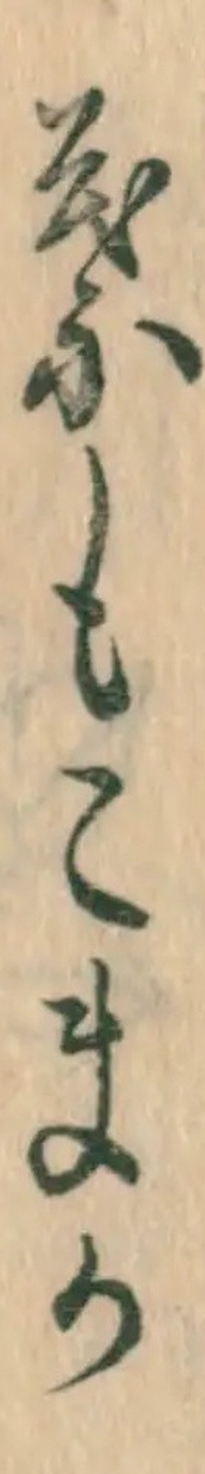葉もこまか
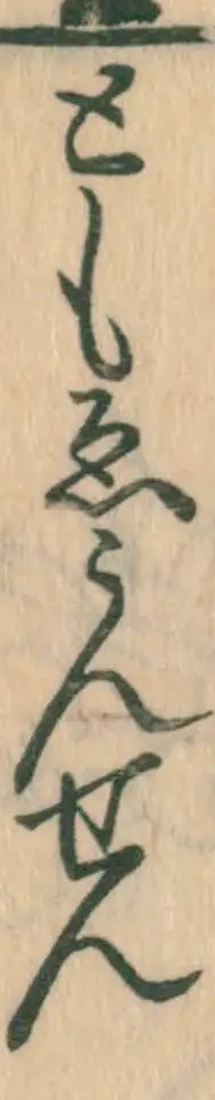▲ともゑうんせん
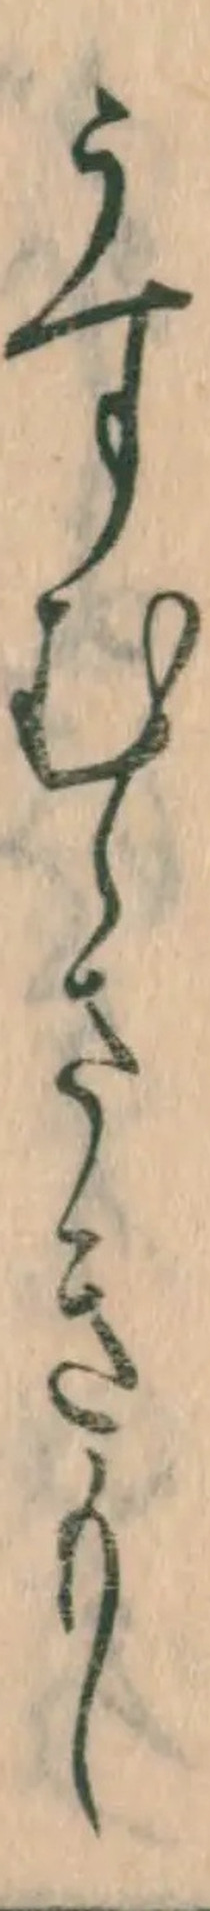うすむらさきもゝ
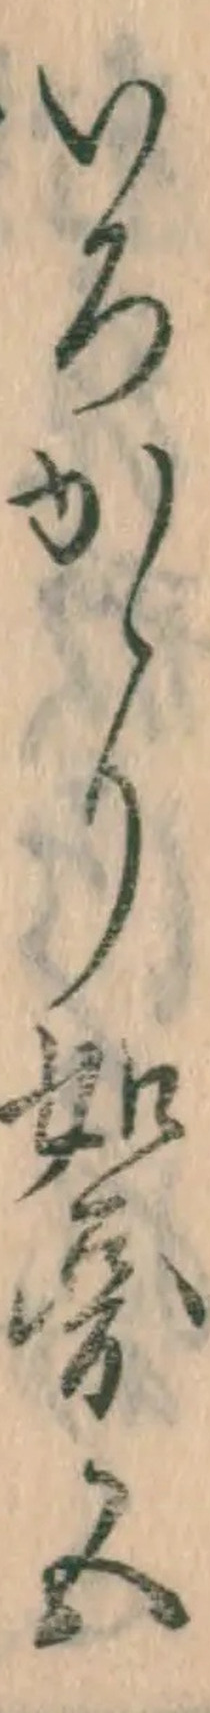いろかゝり如図五
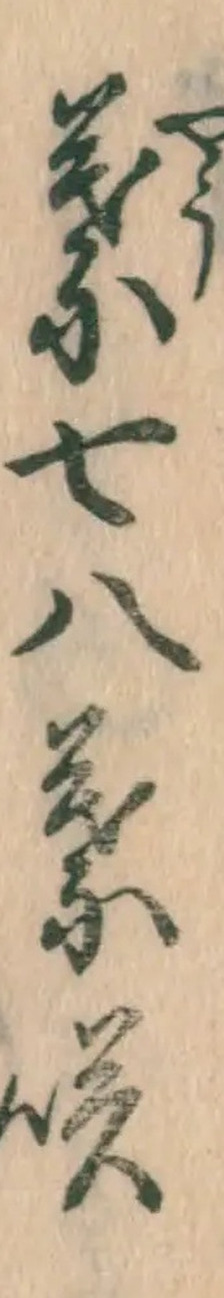葉七八葉咲
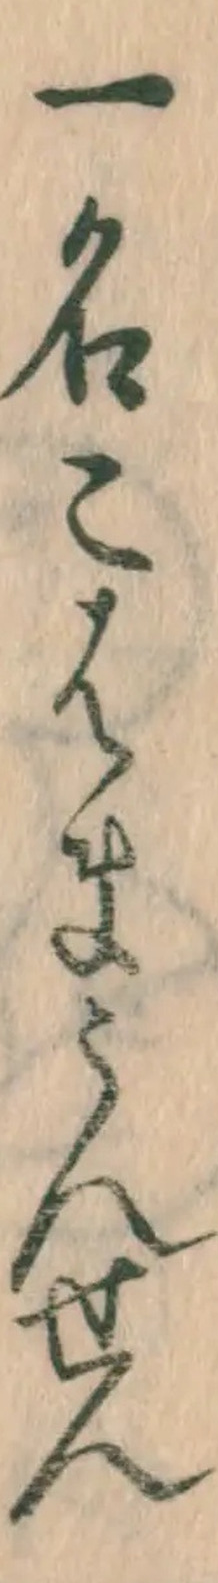一名こはまうんせん
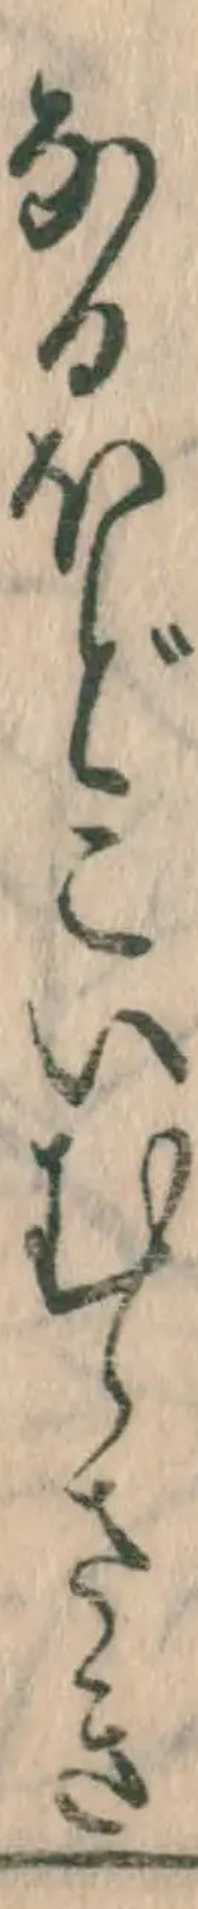なるほどこいむらさき
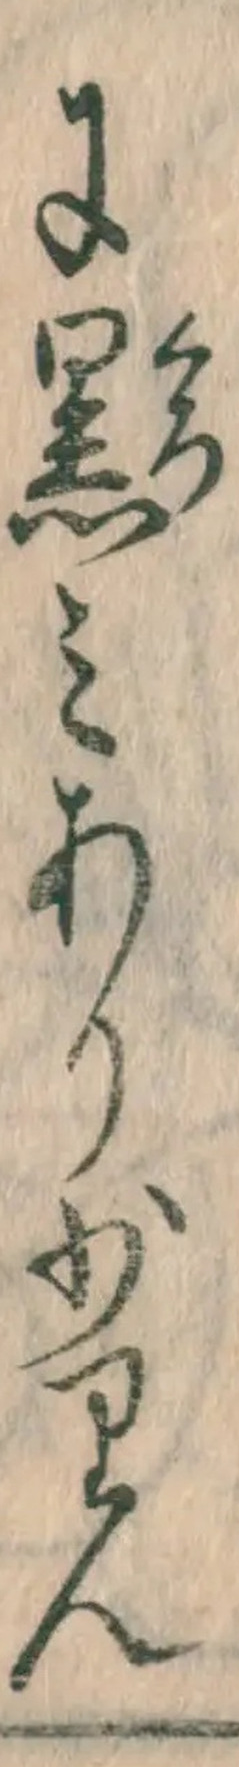に黒みあり少りん
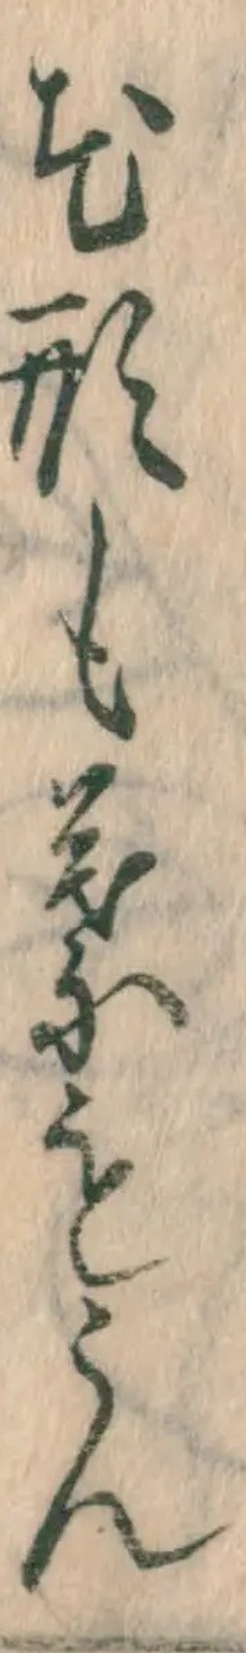花形も葉もうん
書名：錦繍枕 5巻. [2]
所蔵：国立国会図書館 National Diet Library, JAPAN
